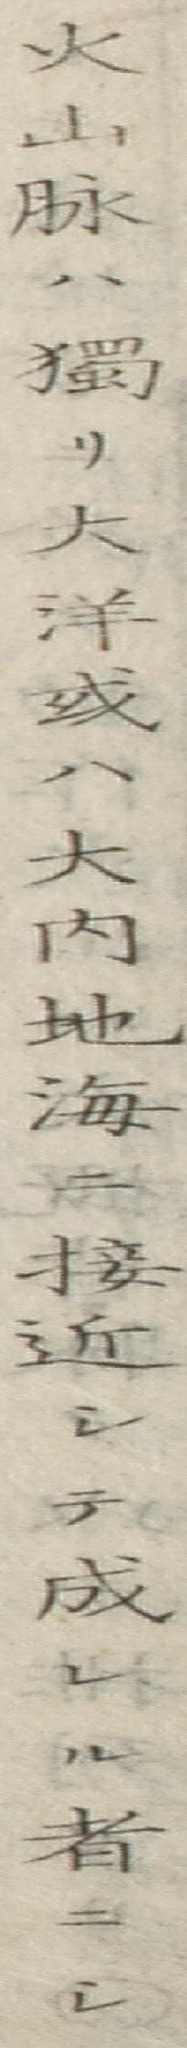火山脈ハ濁リ大洋或ハ大内地海ニ接近シテ成レル者ニシ
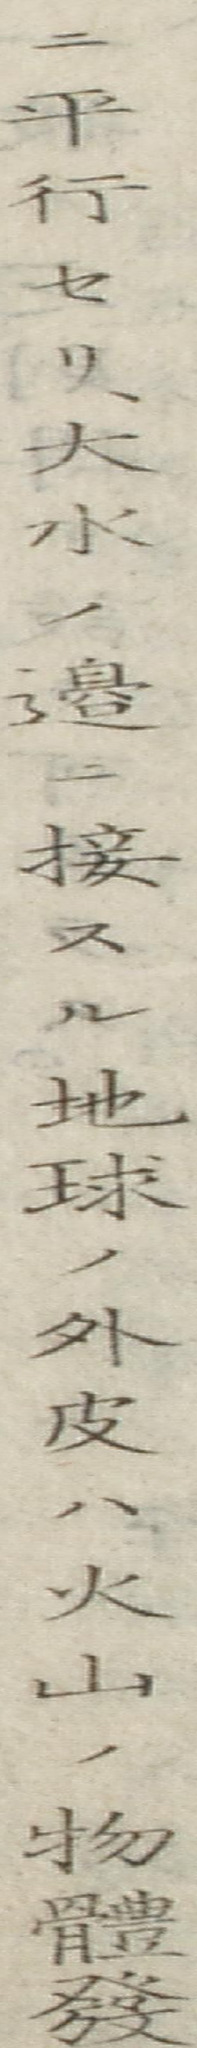ニ平行セリ、大水ノ辺ニ接スル地球ノ外皮ハ火山ノ物体発
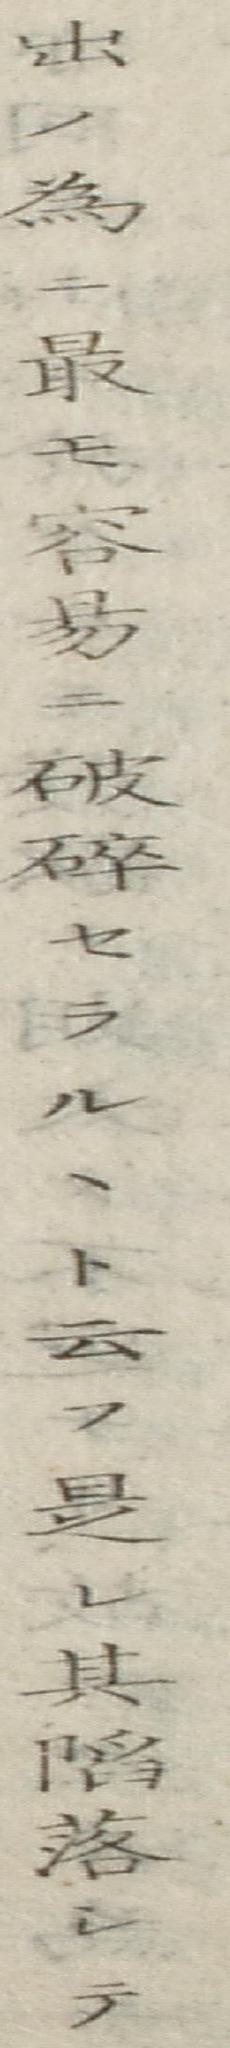出ノ為ニ最モ容易ニ破砕セラルヽト云フ是レ其陥落シテ
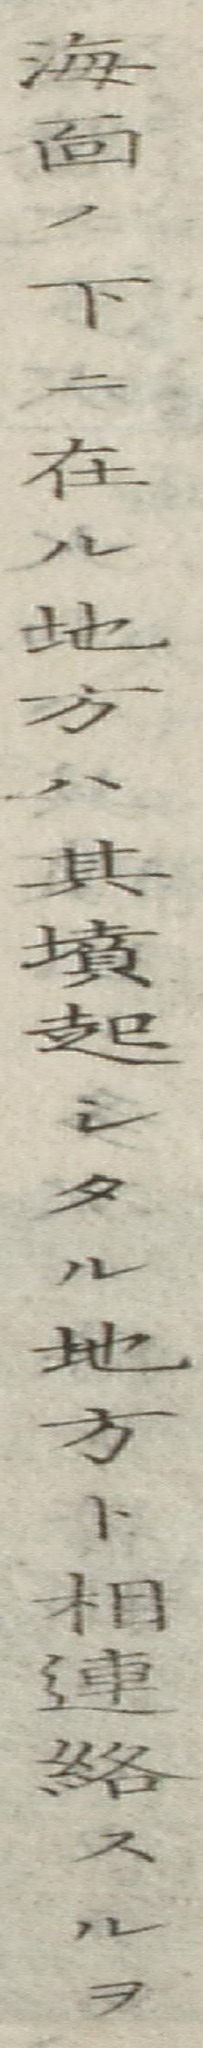海面ノ下ニ在ル地方ハ其墳起シタル地方ト相連絡スルヲ
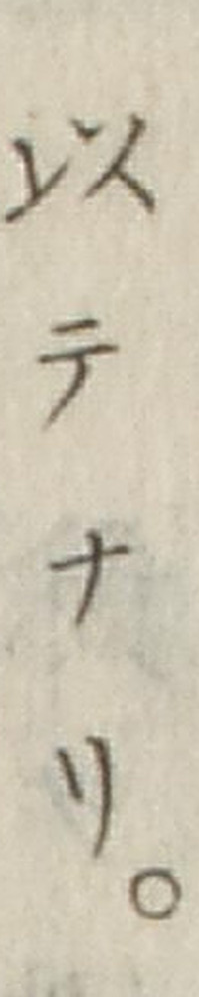以テナリ。
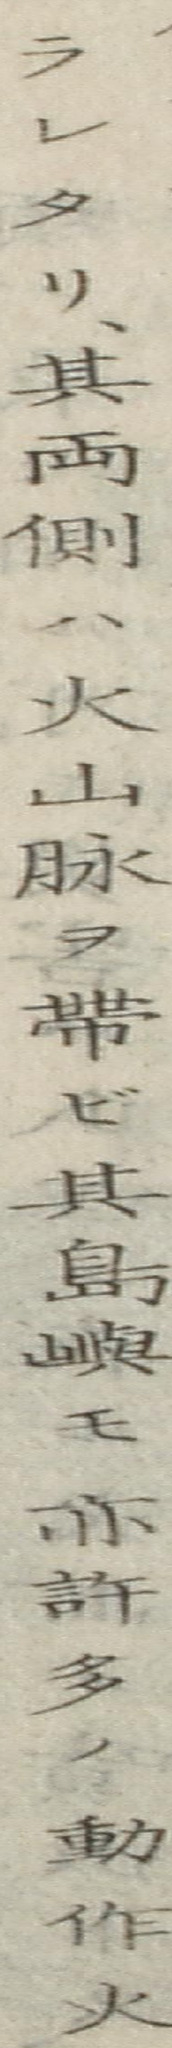ラレタリ、其両側ハ火山脈ヲ帯ビ其島嶼モ亦許多ノ動作火
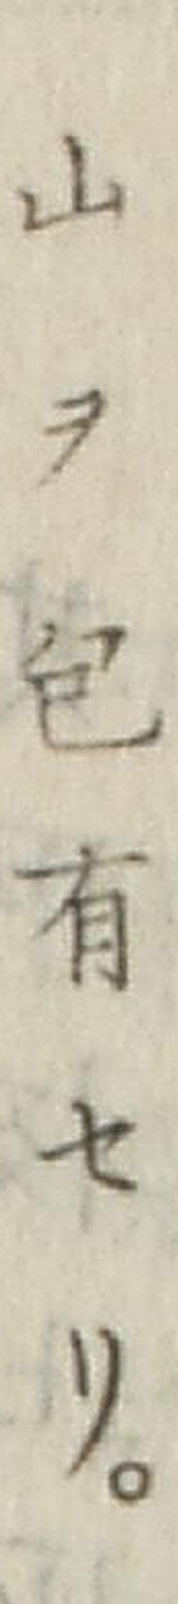山ヲ包有セリ。
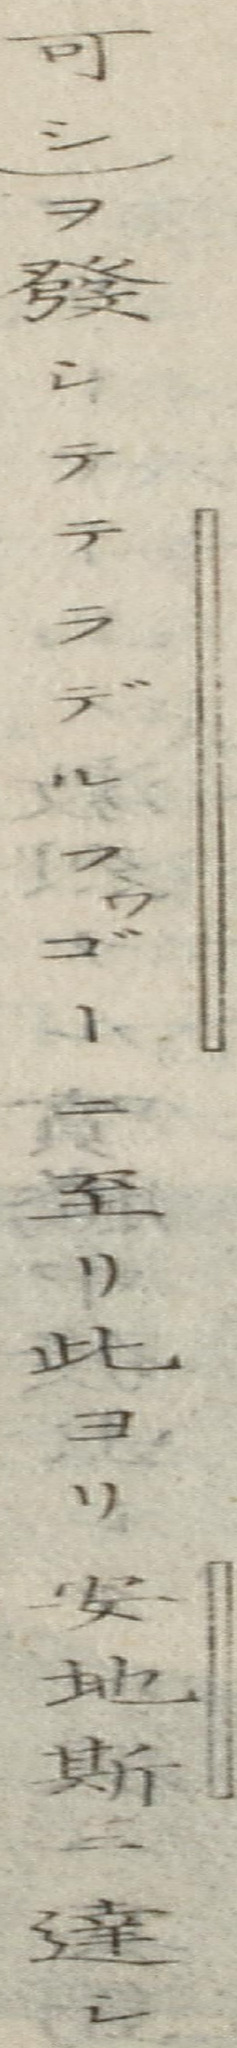可シ）ヲ発シテテラデルフワゴーニ至リ此ヨリ安地斯ニ達シ
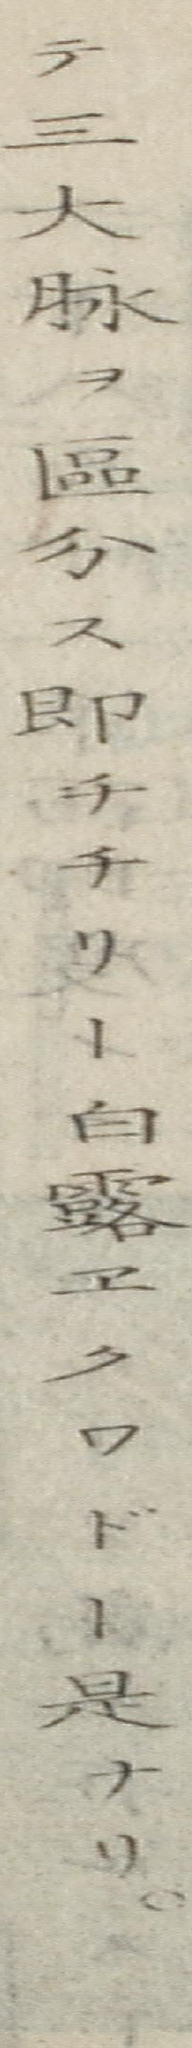テ三大脈ヲ区分ス即チチリー白露ヱクワドー是ナリ。
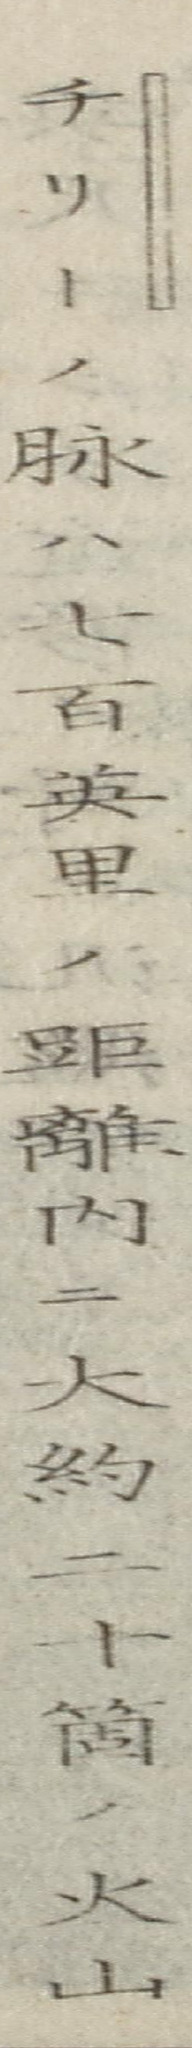チリーノ脈ハ七百英里ノ距離内ニ大約二十箇ノ火山
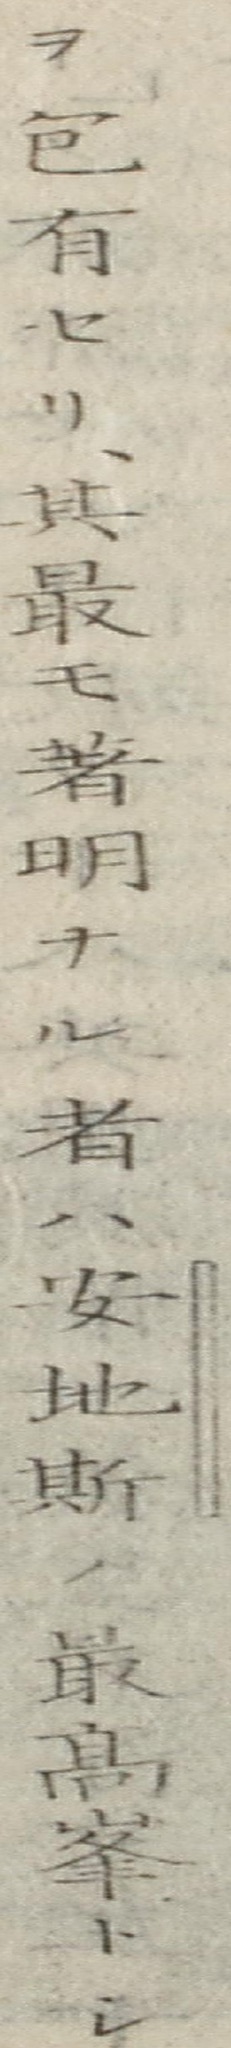ヲ包有セリ、其最モ著名ナル者ハ安地斯ノ最高峯トシ
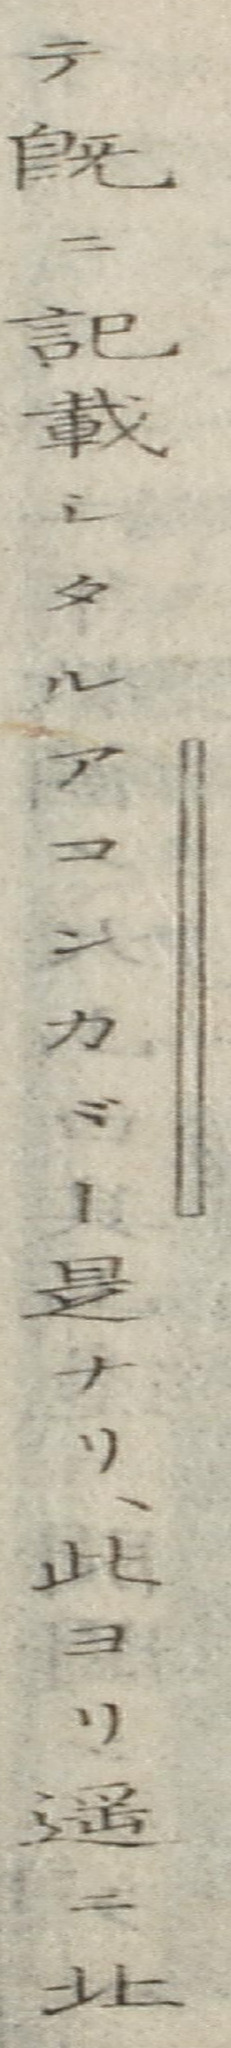テ既ニ記載シタルアコンカヾー是ナリ、此ヨリ遙ニ北
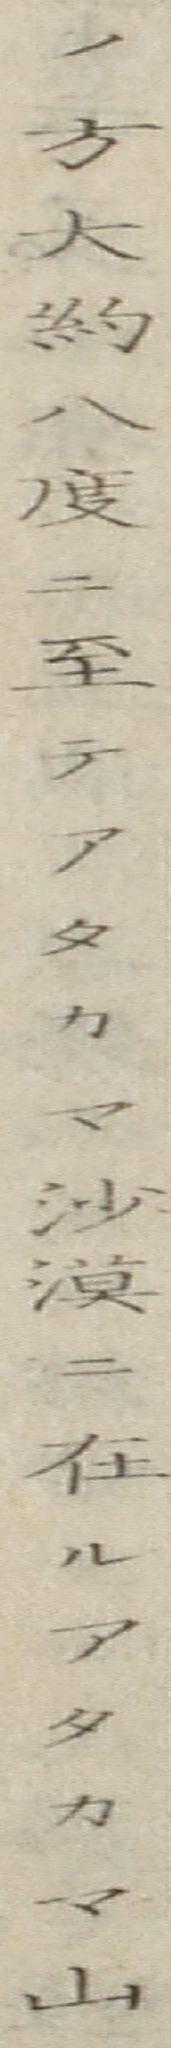ノ方大約八度ニ至テアタカマ沙漠ニ在ルアタカマ山
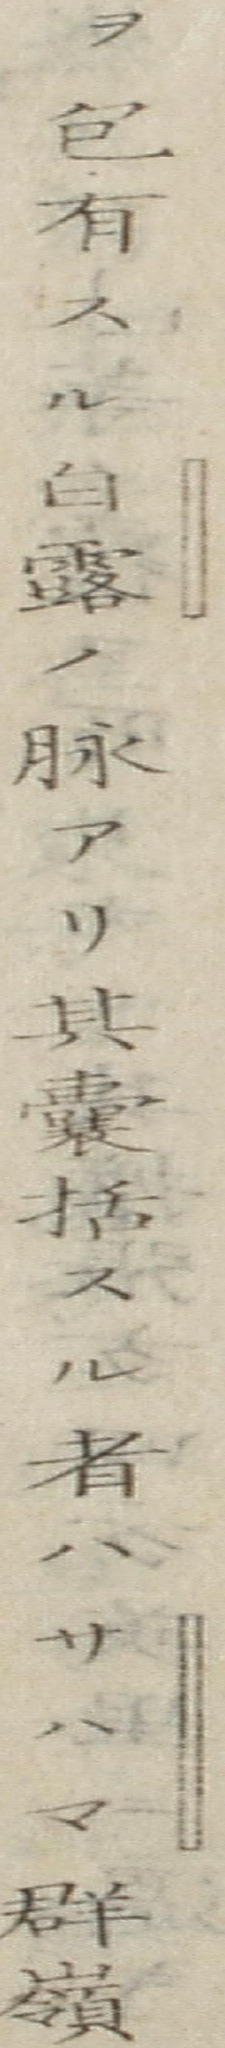ヲ包有スル白露ノ脈アリ其囊括スル者ハサハマ群嶺
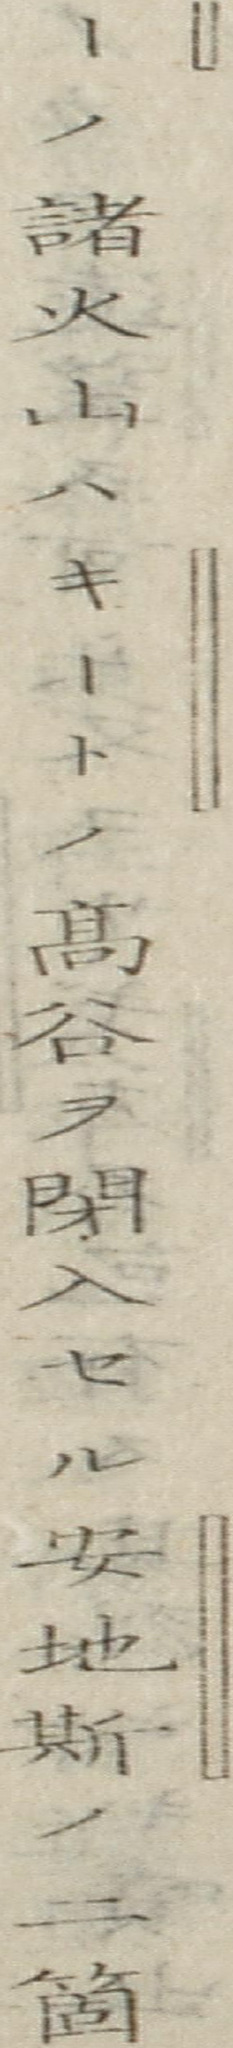ーノ諸火山ハキートノ高谷ヲ閉入セル安地斯ノ二箇
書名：地形論　巻二
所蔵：東京大学地震研究所図書室 Earthquake Research Institute Library, The University of Tokyo, JAPAN
